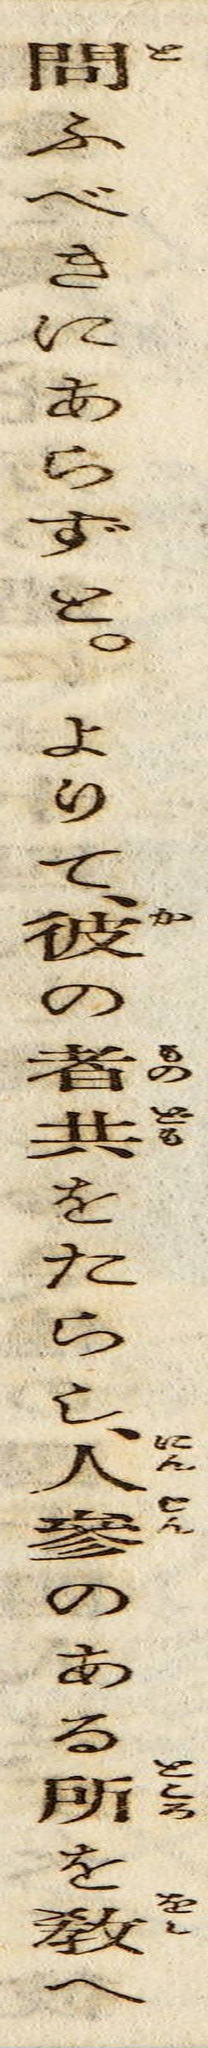問ふべきにあらずと。よりて、彼の者共をたらし、人参のある所を教へ
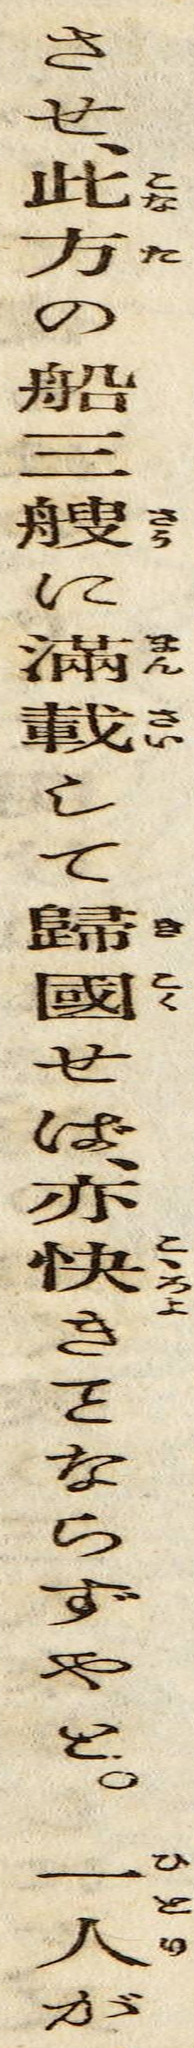させ、此方の船三艘に満載して帰国せば、亦快きことならずやと。一人が
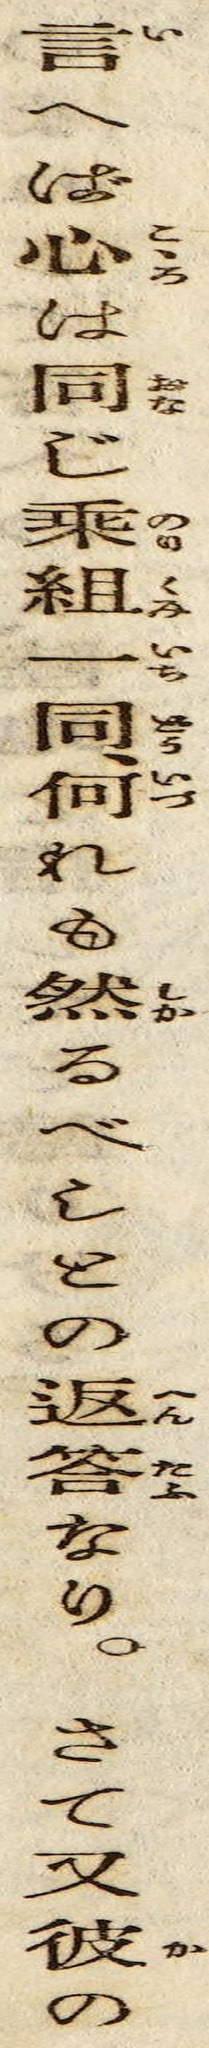言へば心は同じ乗組一同、何れも然るべしとの返答なり。さて又彼の
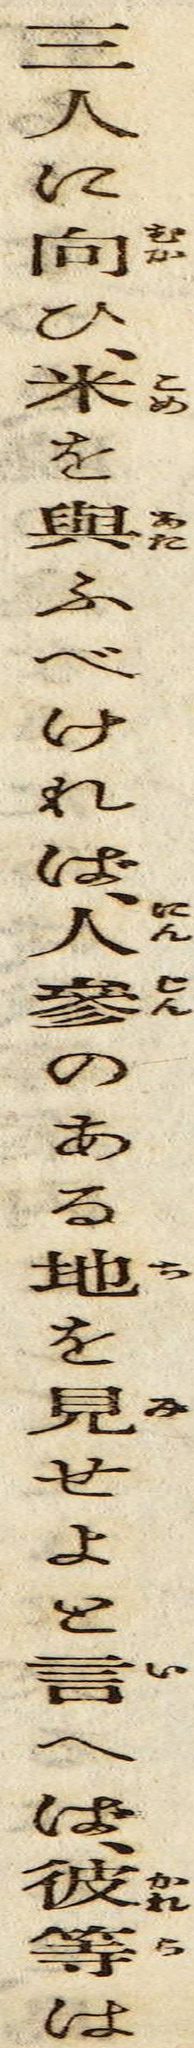三人に向ひ、米を与ふべければ、人参のある地を見せよと言へば、彼等は

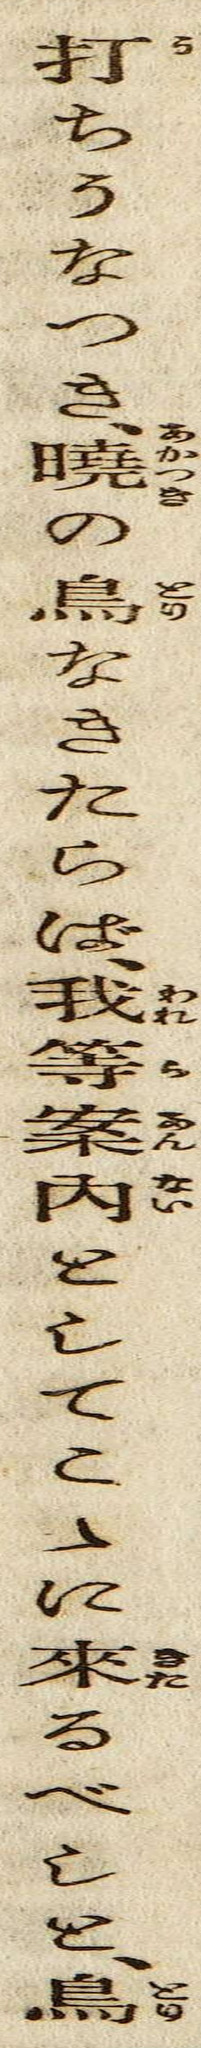打ちうなつき、暁の鳥なきたらば、我等案内としてこゝに来るべしと、鳥
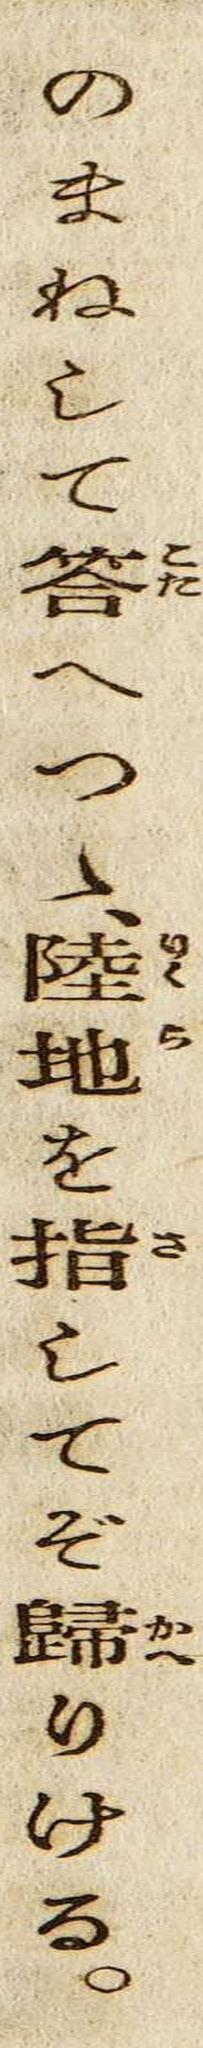のまねして答へつゝ、陸地を指してぞ帰りける。
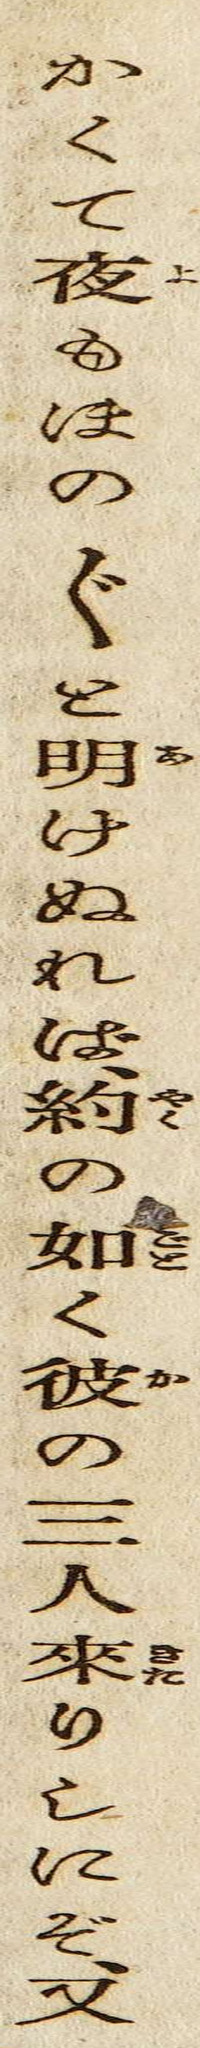かくて夜もほの〴〵と明けぬれば、約の如く彼の三人来りしにぞ、又
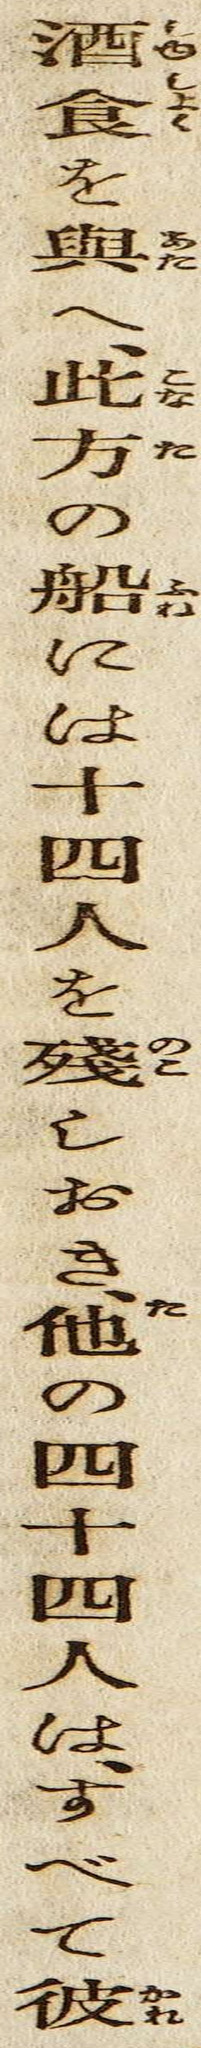酒食を与へ、此方の船には十四人を残しおき、他の四十四人は、すべて彼
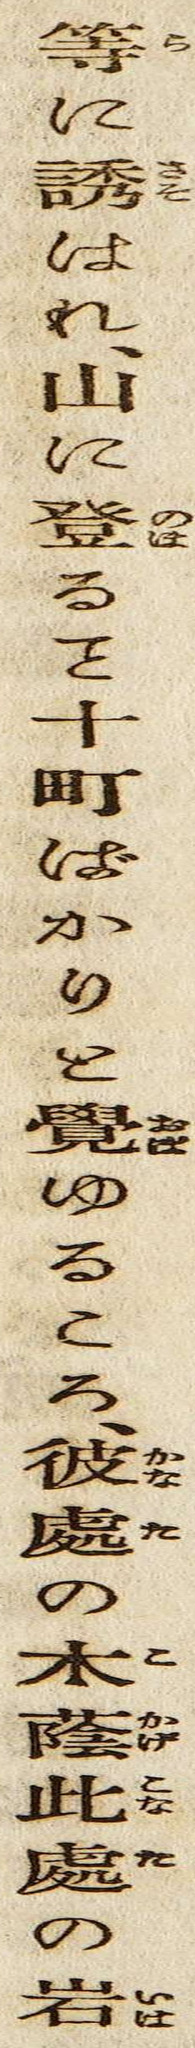等に誘はれ、山に登ること十町ばかりと覚ゆるころ、彼処の木蔭此処の岩
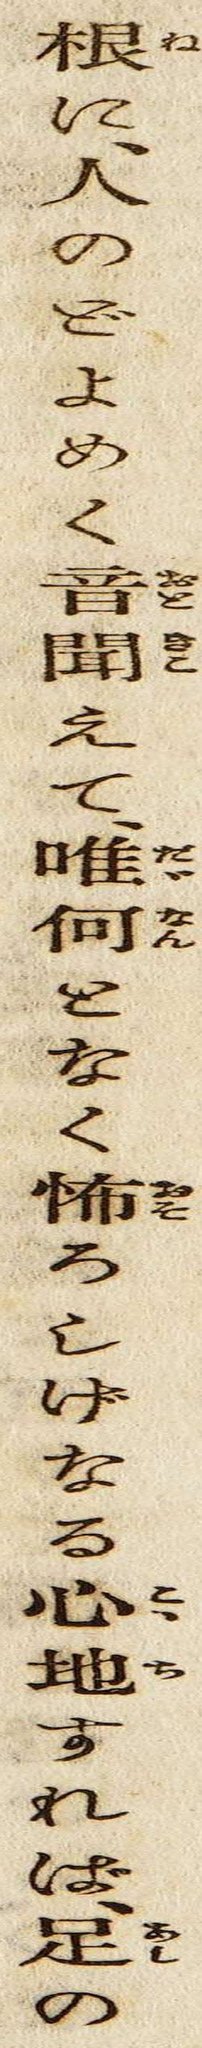根に、人のどよめく音聞えて、唯何となく怖ろしげなる心地すれば、足の
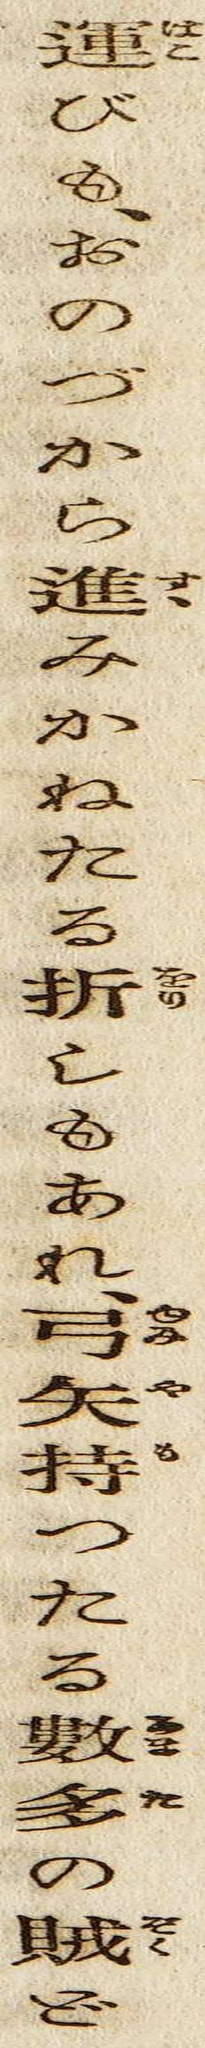運びも、おのづから進みかねたる折しもあれ、弓矢持つたる数多の賊ど
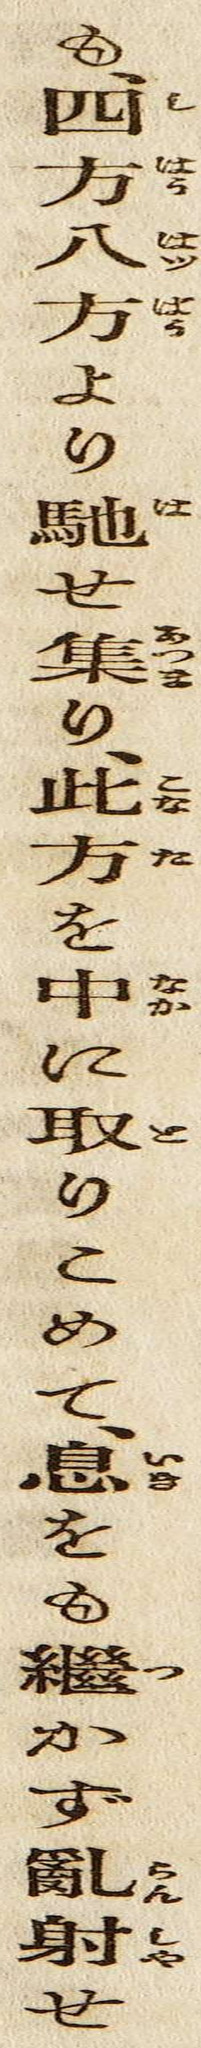も、四方八方より馳せ集り、此方を中に取りこめて、息をも継かず乱射せ
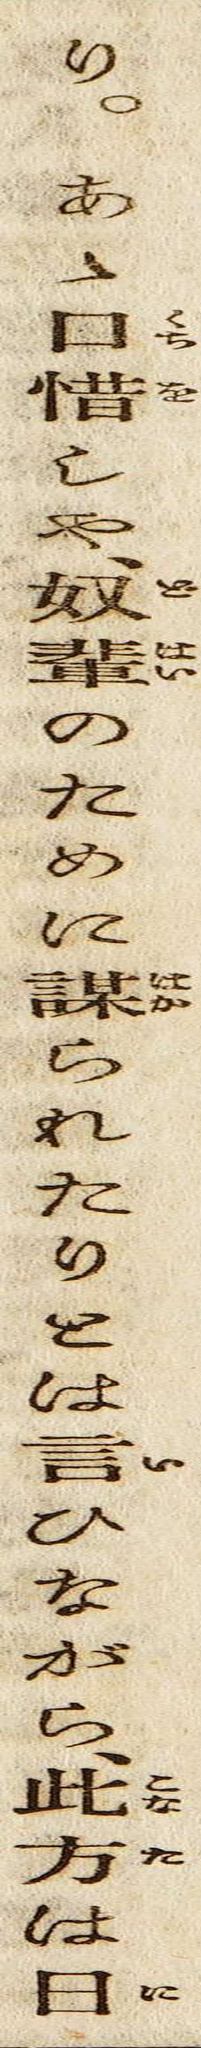り。あゝ口惜しや、奴輩のために謀られたりとは言ひながら、此方は日
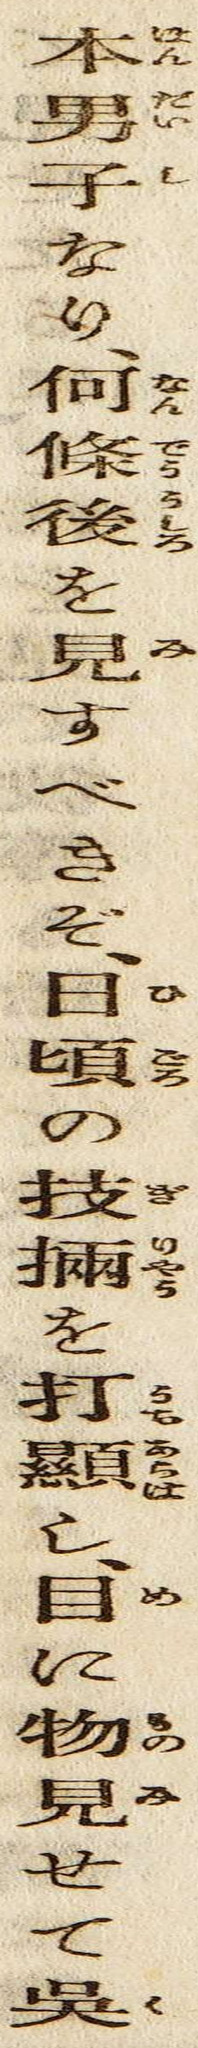本男子なり、何条後を見すべきぞ、日頃の技掚を打顕し、目に物見せて呉
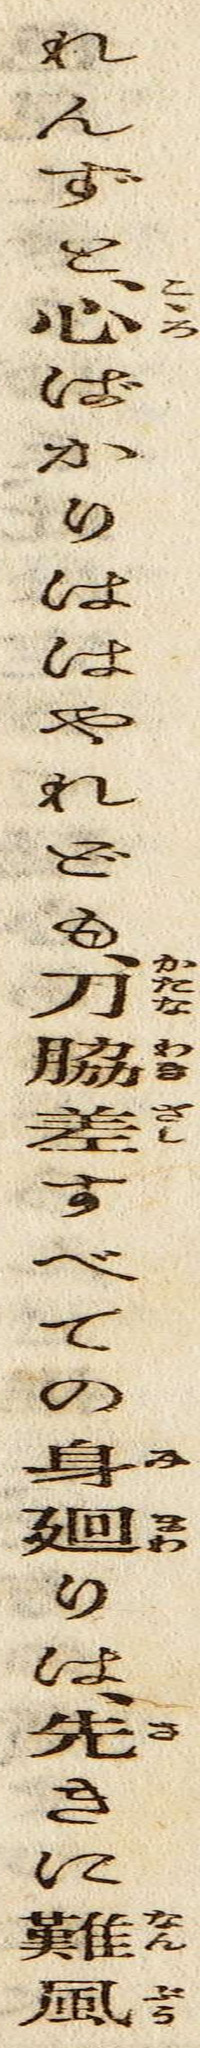れんずと、心ばかりははやれども、刀脇差すべての身廻りは、先きに難風
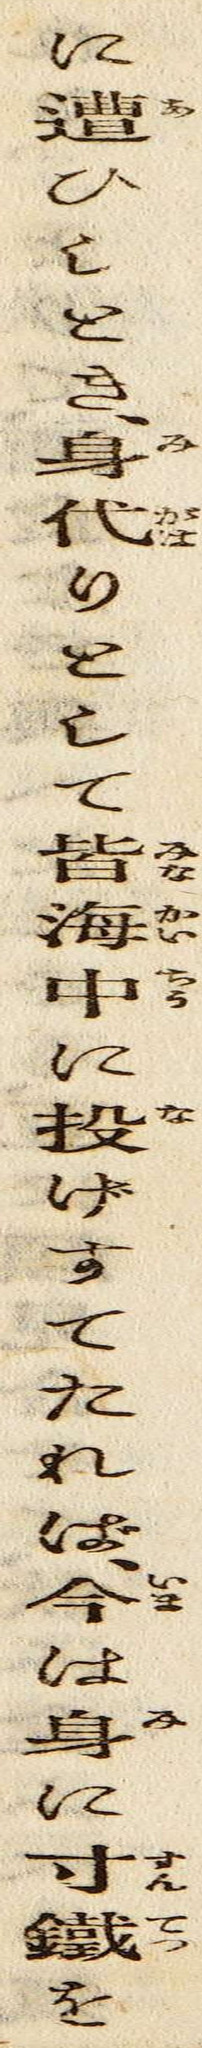に遭ひしとき、身代りとして皆海中に投げすてたれば、今は身に寸鉄を
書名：日本漂流譚
